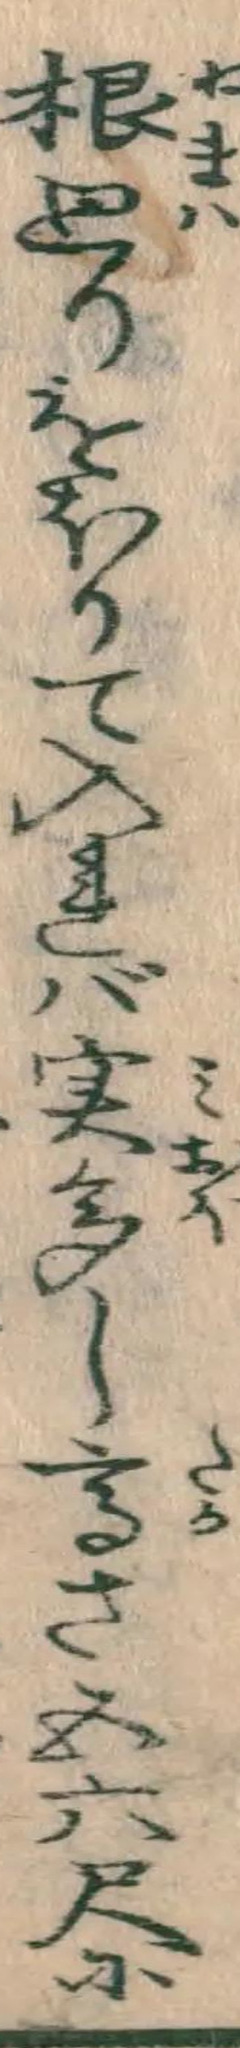根廻りをほりて入れば実多し高さ五六尺に
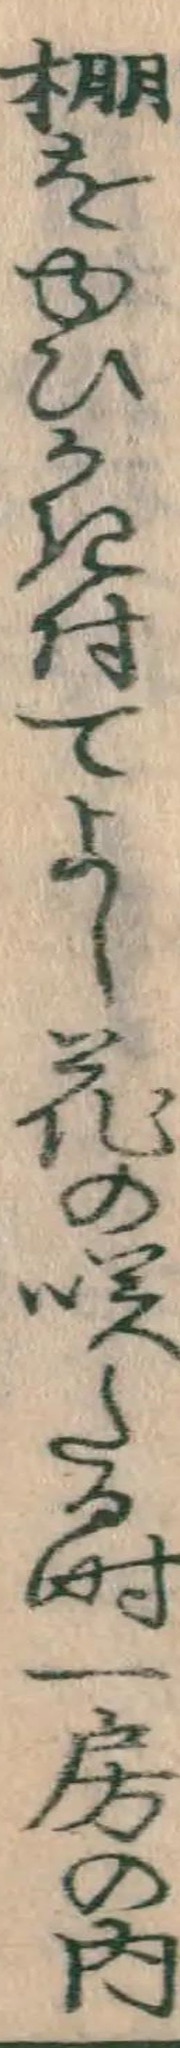棚をゆひかき付てよし花の咲たる時一房の内
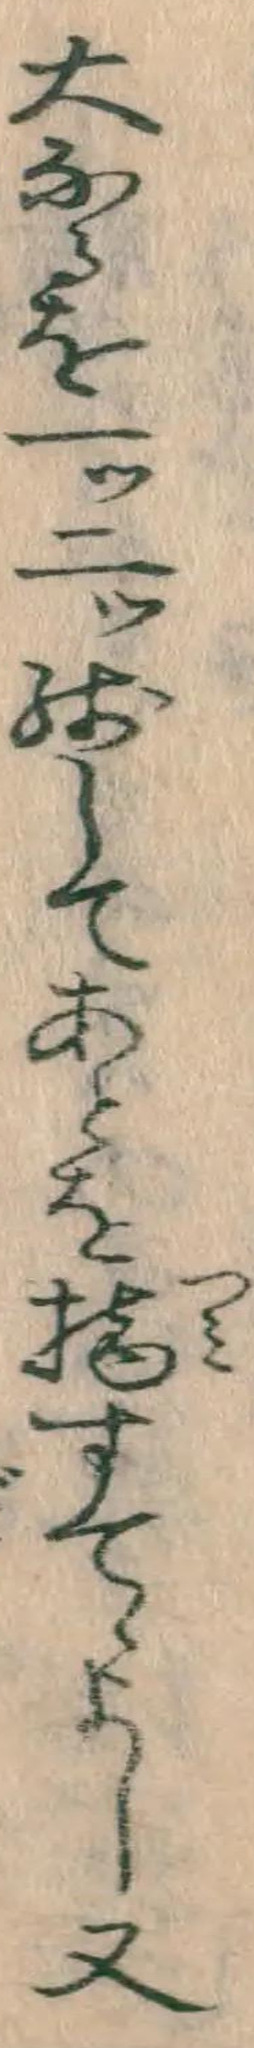大なるを一ッ二ッ残してあとを摘すてゝよし又
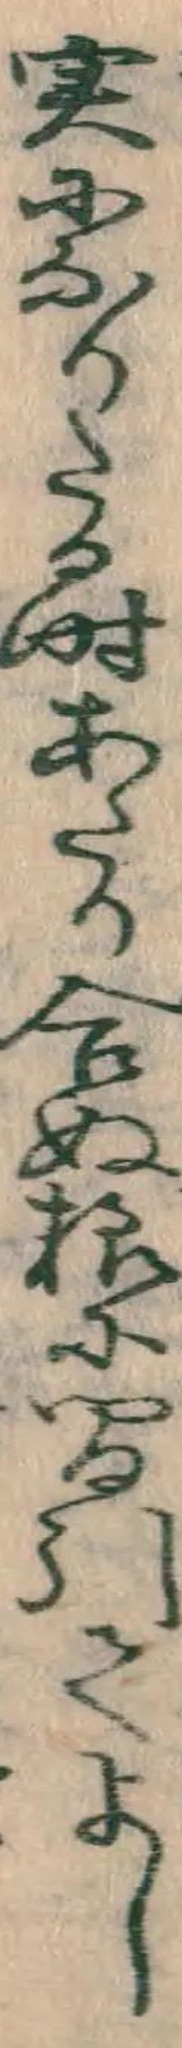実になりたる時あたり合ぬ様に間引てよし
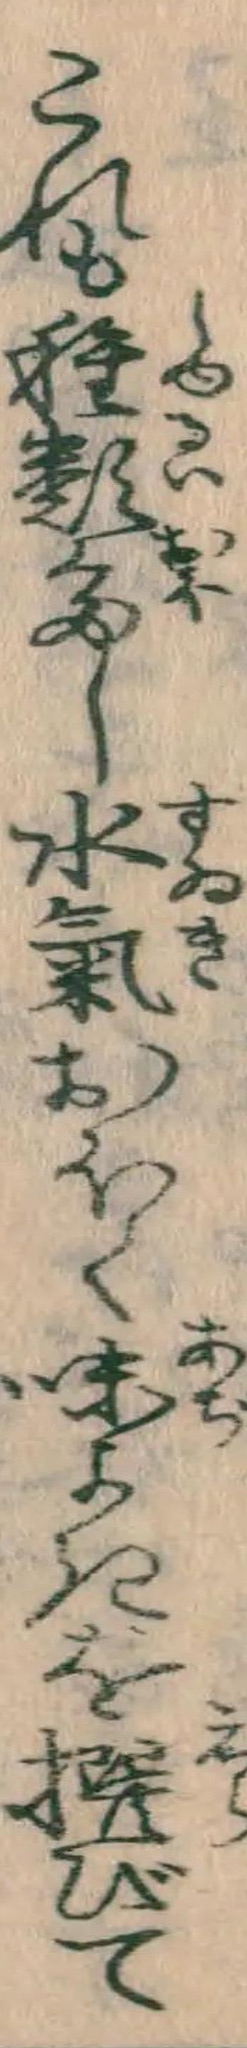これも種類多し水気おほく味よきを撰びて
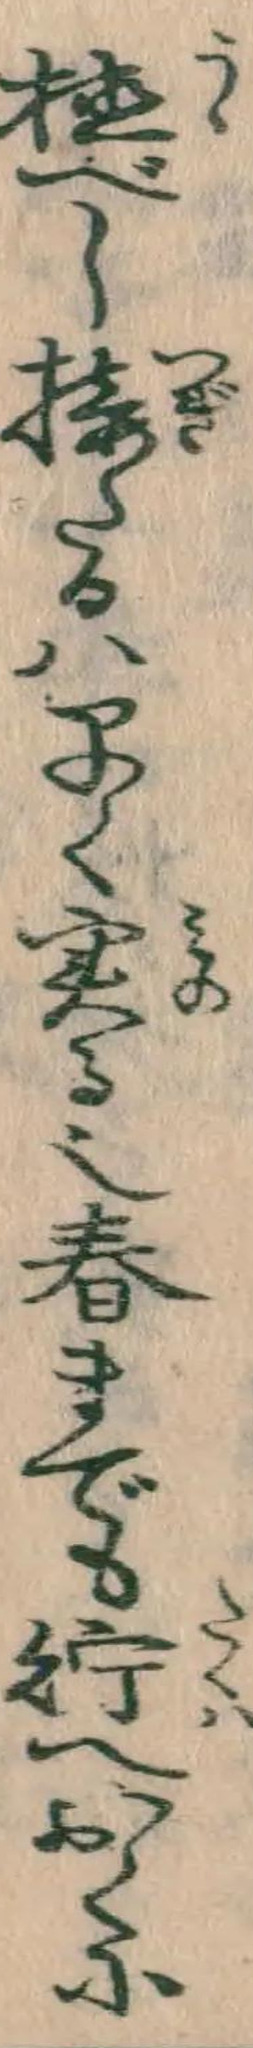植べし接たるは早く実る也春までも貯へおくに
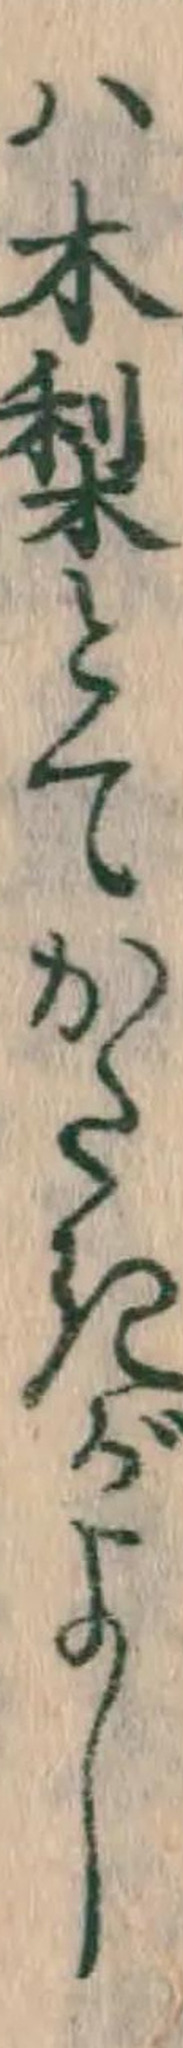は木梨とてかたきがよし
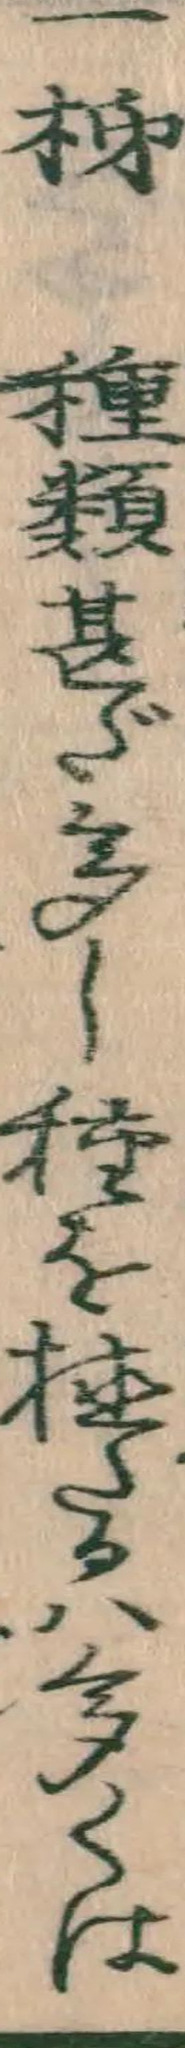一柿種類甚だ多し種を植たるは多くは
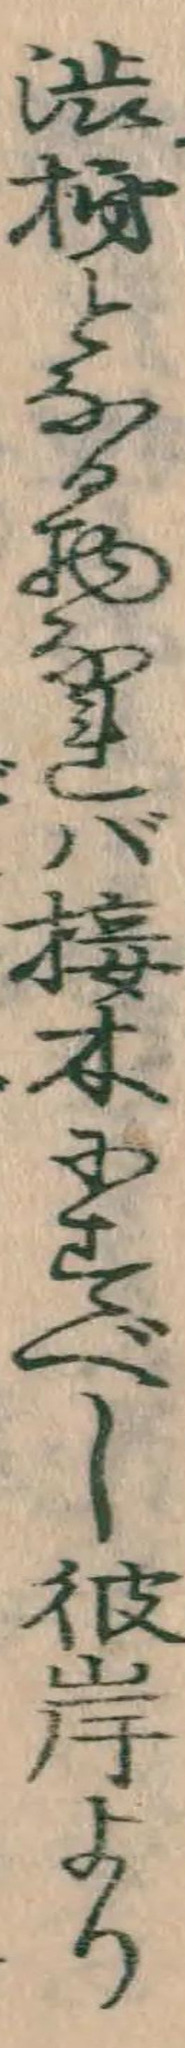渋柿となる物なれば接木にすべし彼岸より
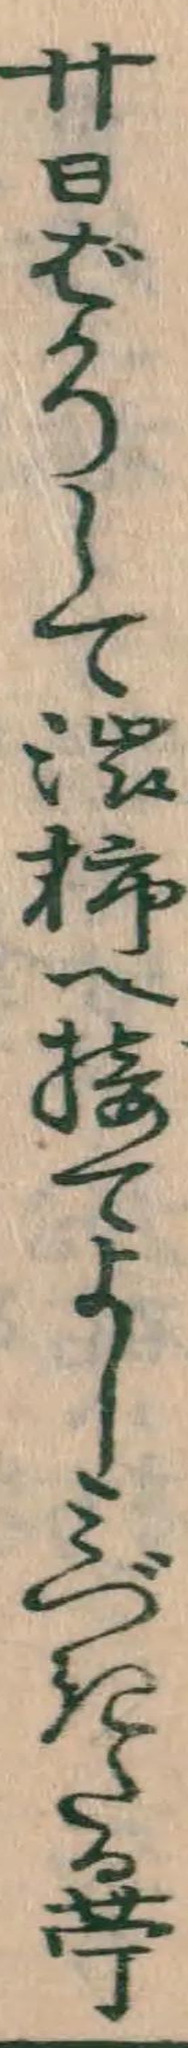廿日ばかりして渋柿へ接てよしみづきたる苧
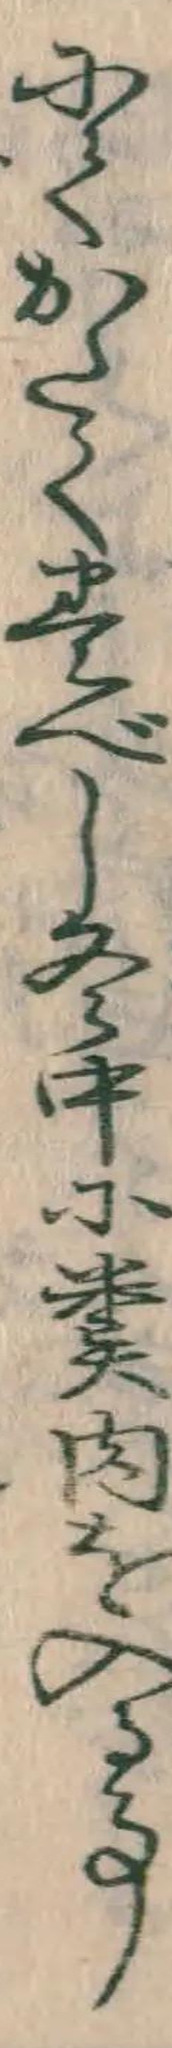にてかたく巻べし冬中に糞肉を入る事
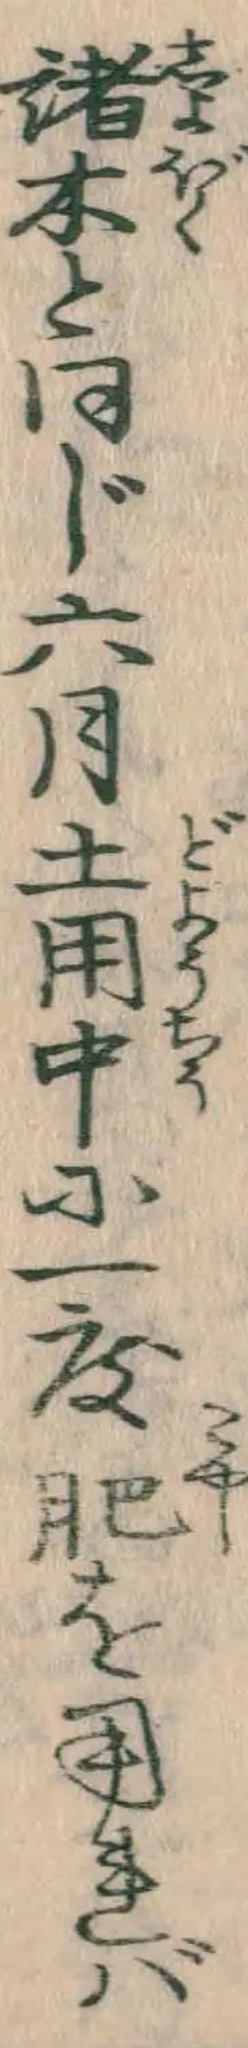諸木と同じ六月土用中に一度肥を用れば
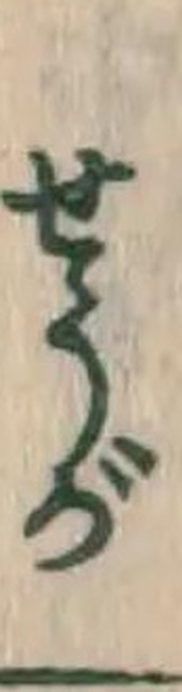せうが
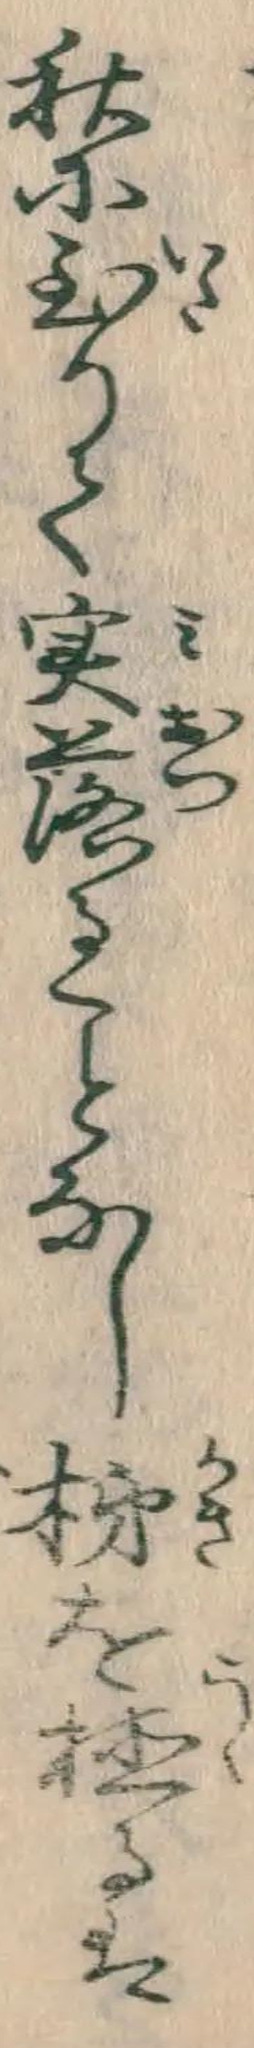秋に至りて実落ることなし柿を植るは
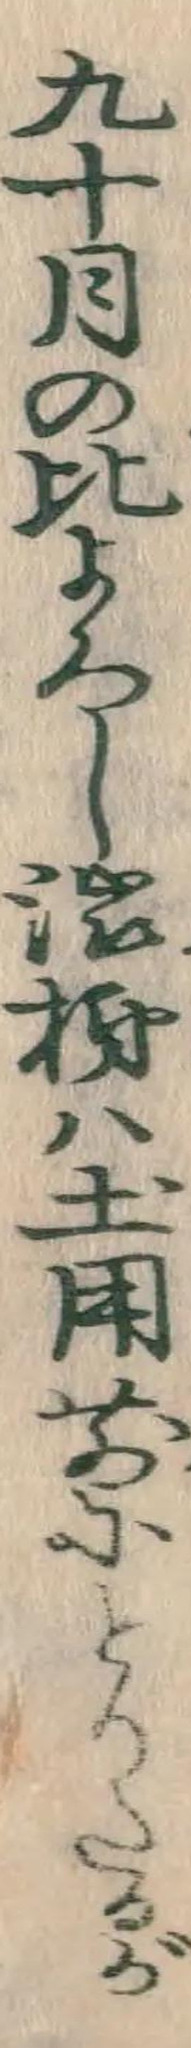九十月の比よろし渋柿は土用前にとりたるが
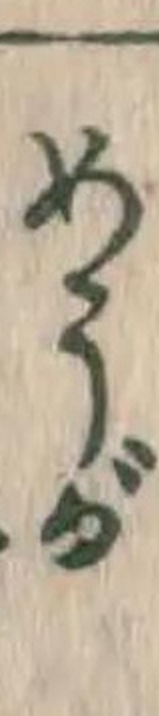せうが
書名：広益秘事大全 3巻. [5]
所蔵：国立国会図書館 National Diet Library, JAPAN
